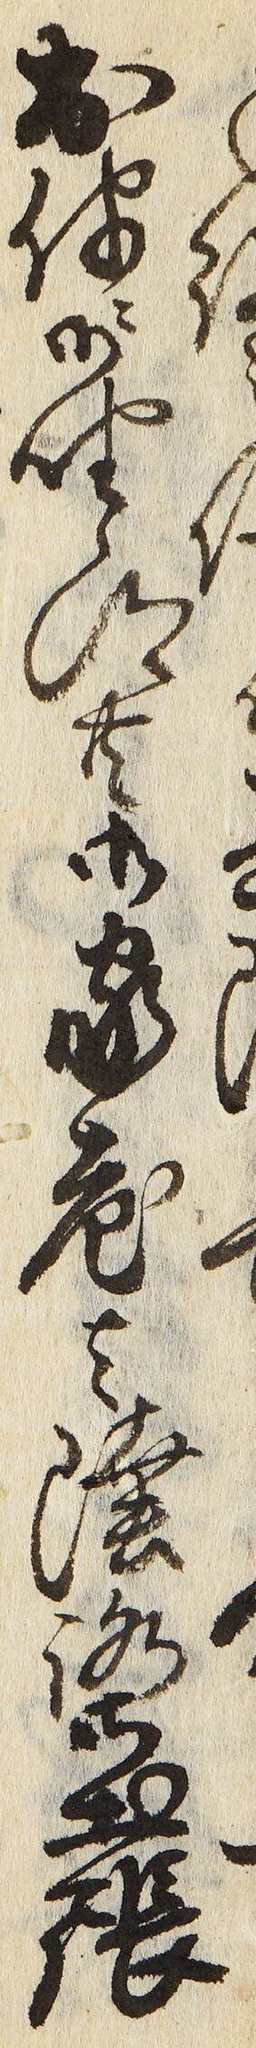出儀ニ御座候得共御家老者陸路御出張
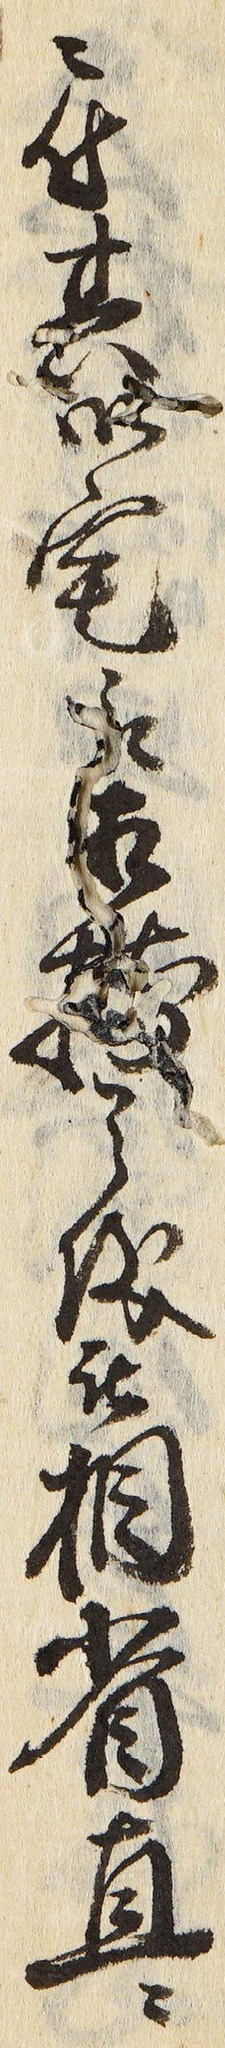ニ付其御宅江相揃候儀被相省直ニ
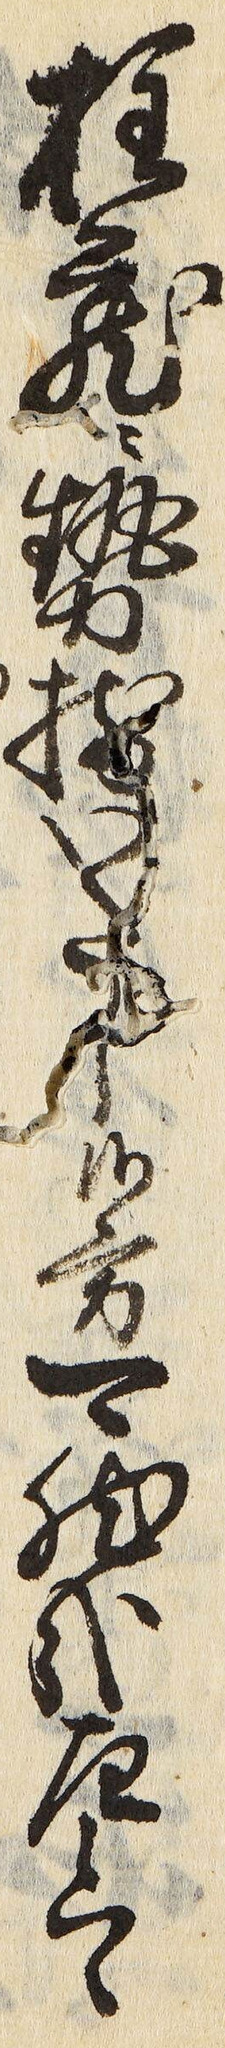柱蔵ニ勢揃いたし候方可然哉左候ハヽ
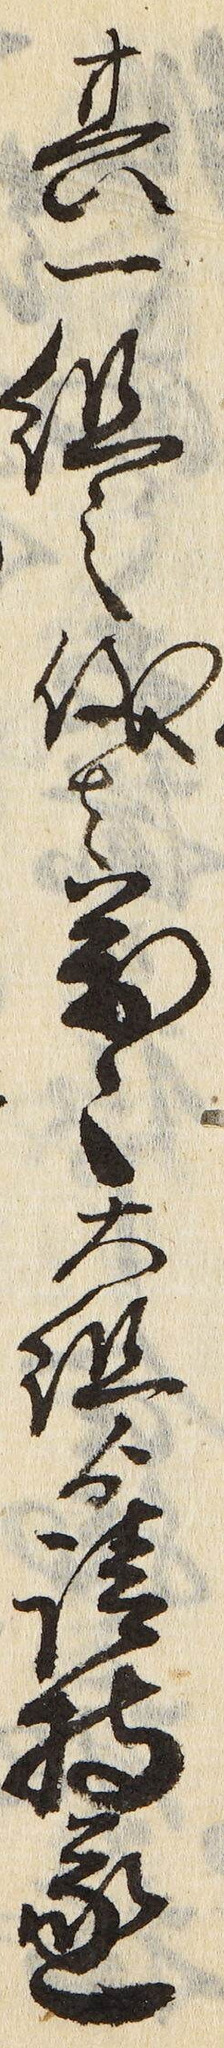其一組之儀者万々大組ゟ請持遂
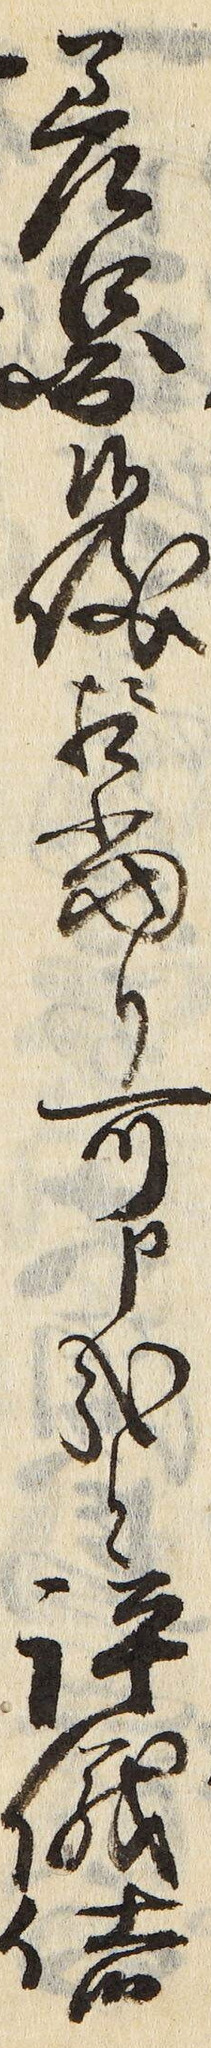差図候儀ニ相当り可申哉と評儀仕候
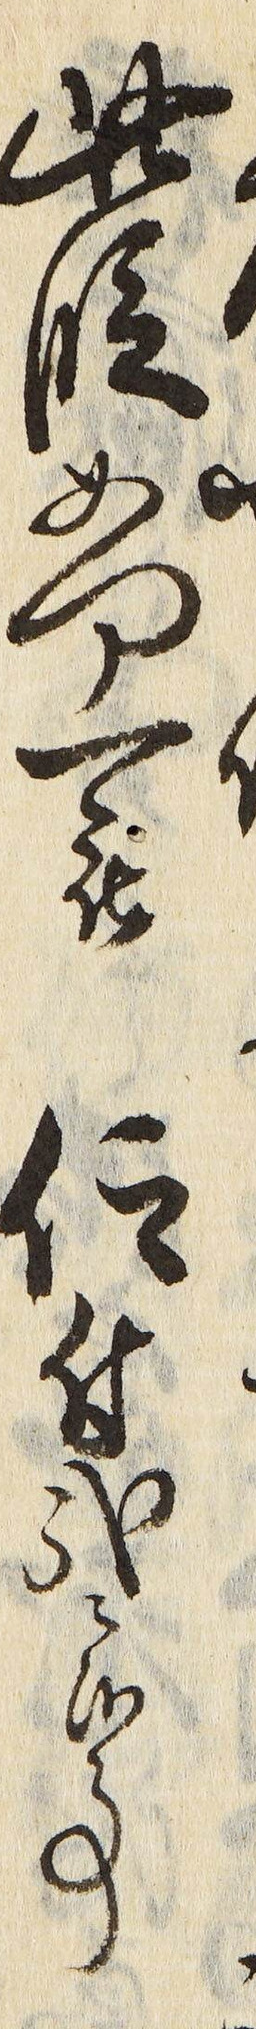此段如何可被仰付哉ニ候事
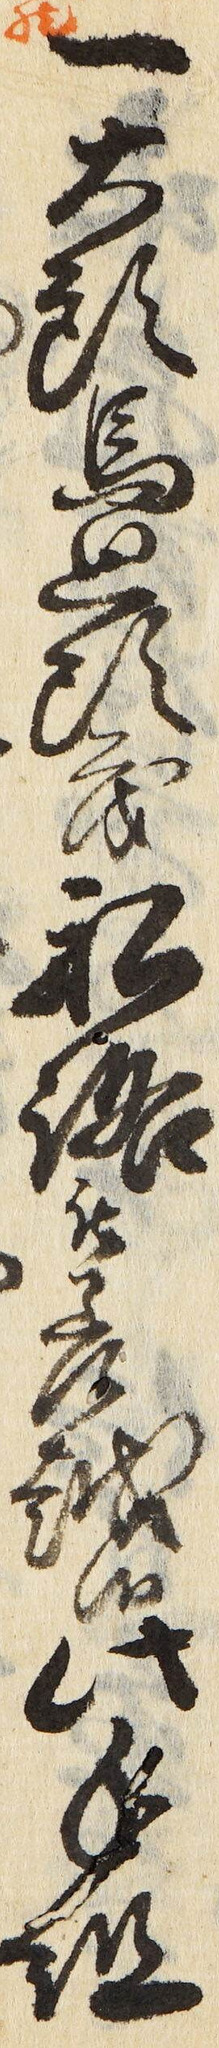一大頭馬廻頭も船路被差越候此手組
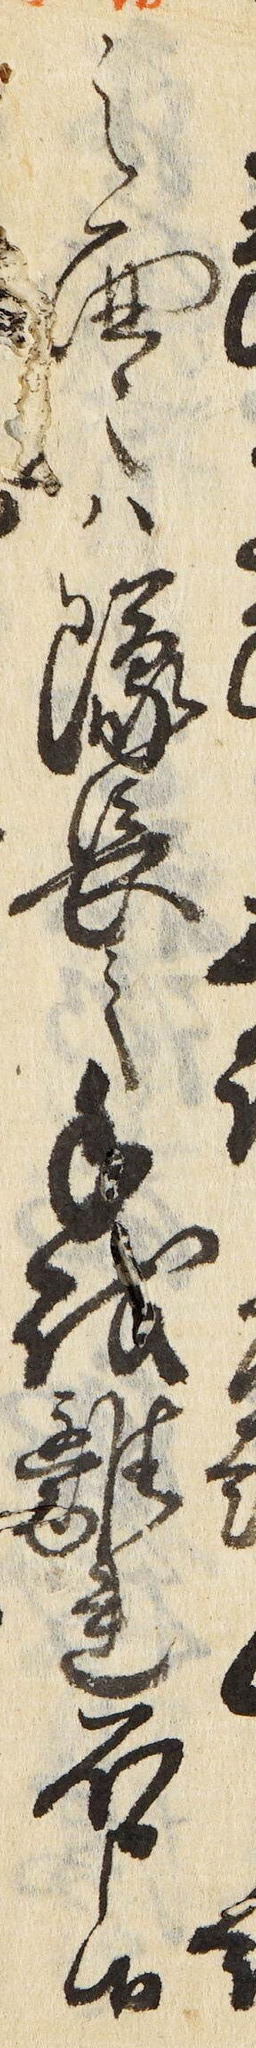之面々ハ隊長之手を離れ不申候
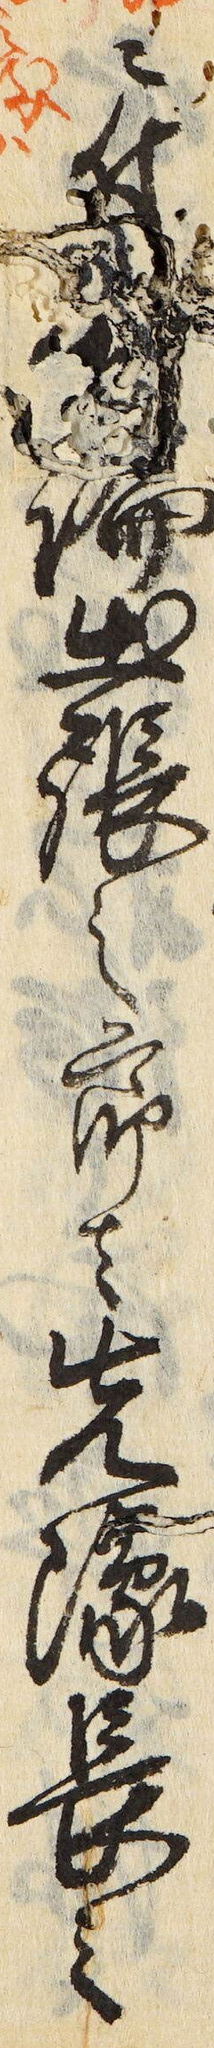ニ付論出張之節者先隊長之

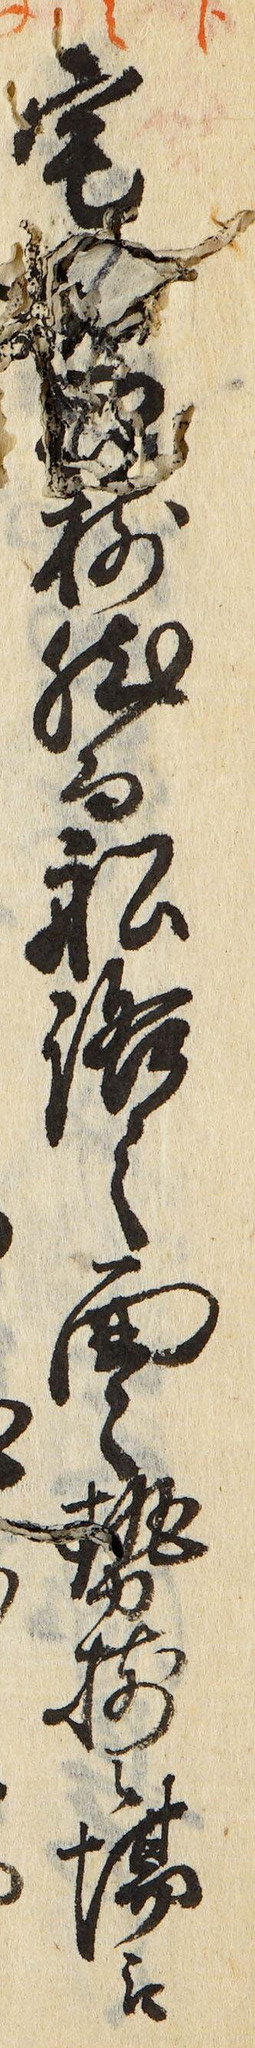宅揃然而船路之面々勢揃之場江
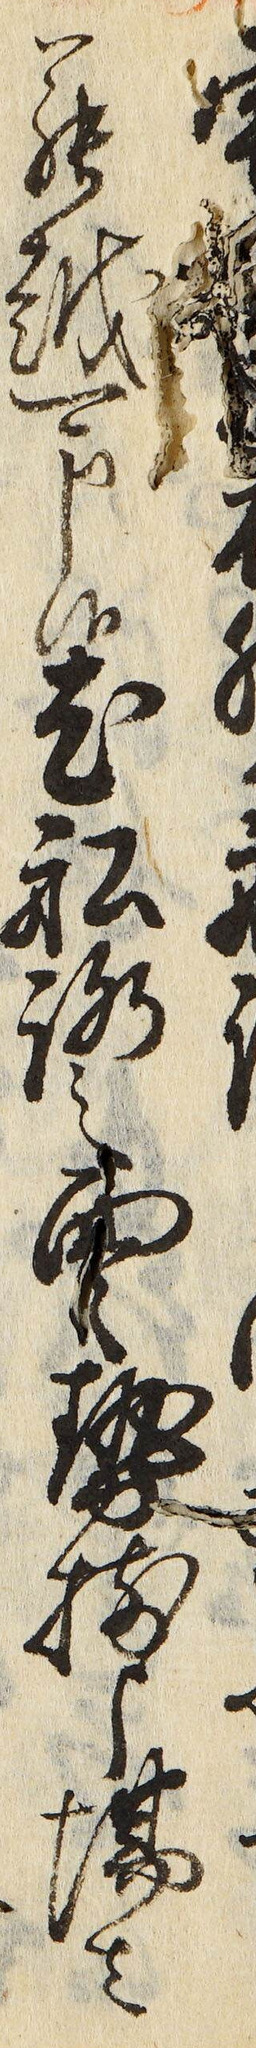罷越可申候尤船路之面々勢揃申場者
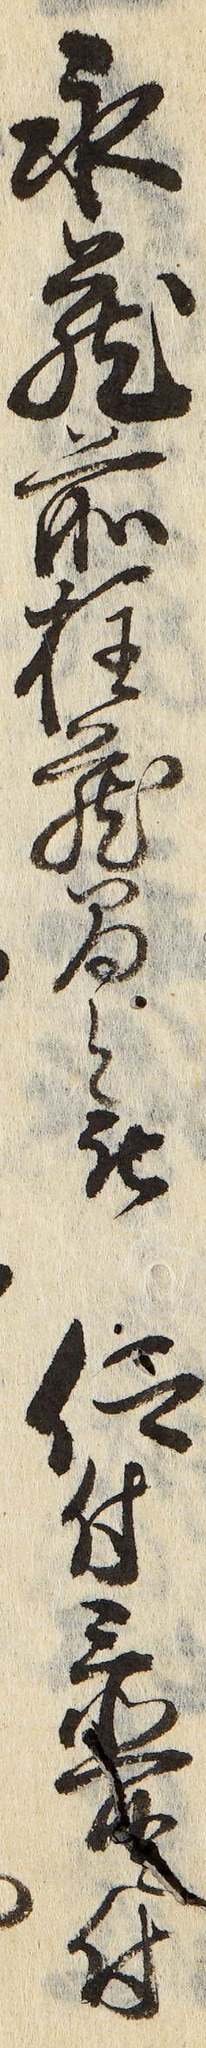永蔵前柱蔵間と被仰付置候ニ付
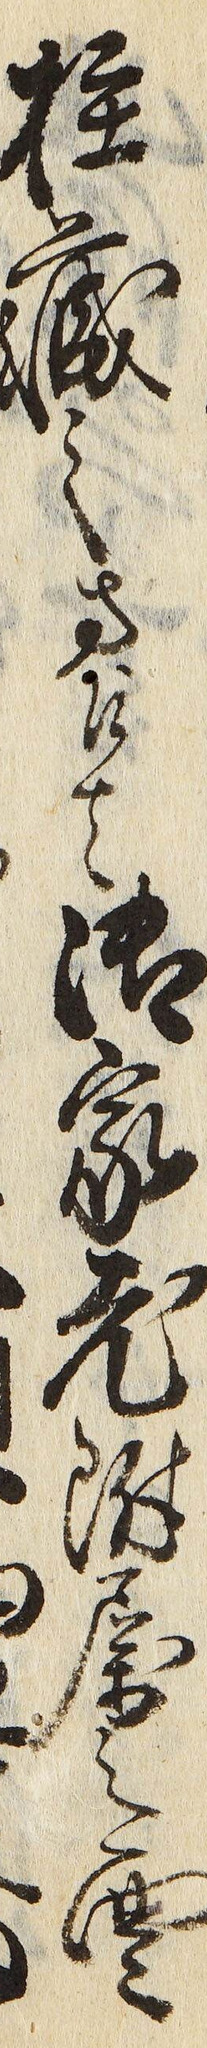柱蔵之方江者御家老付属之面々
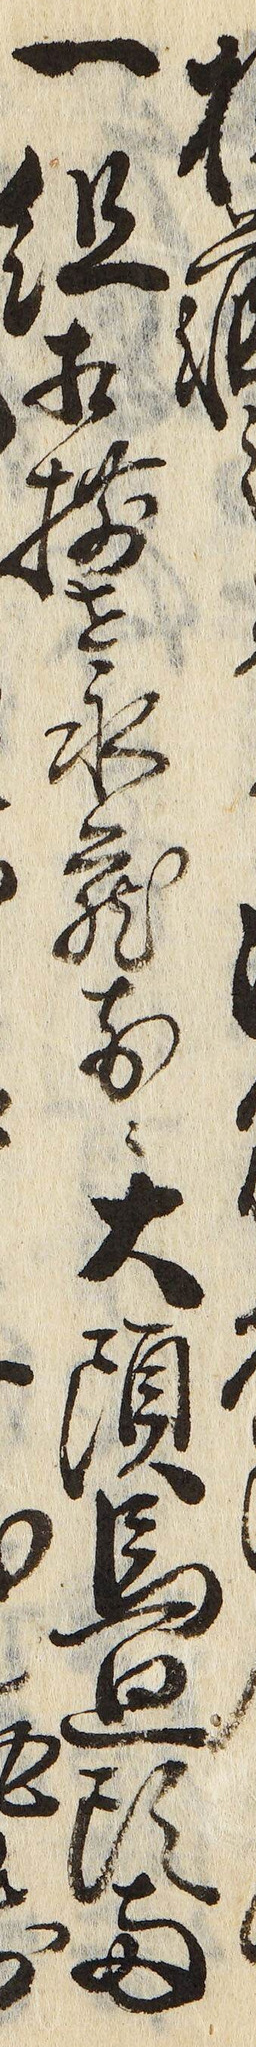一組相揃せ永蔵前ニ大頭馬廻頭両
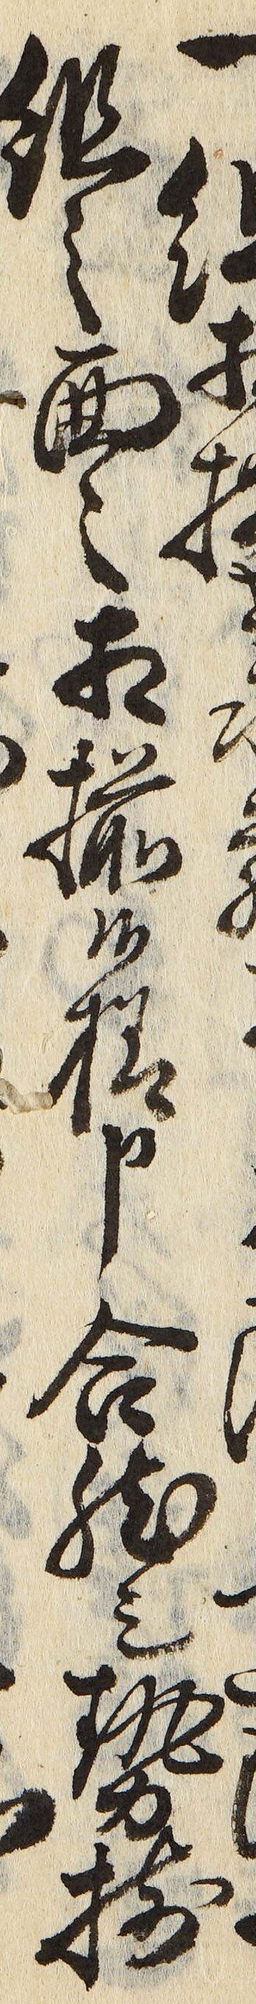組之面々相揃候様申合然シ勢揃
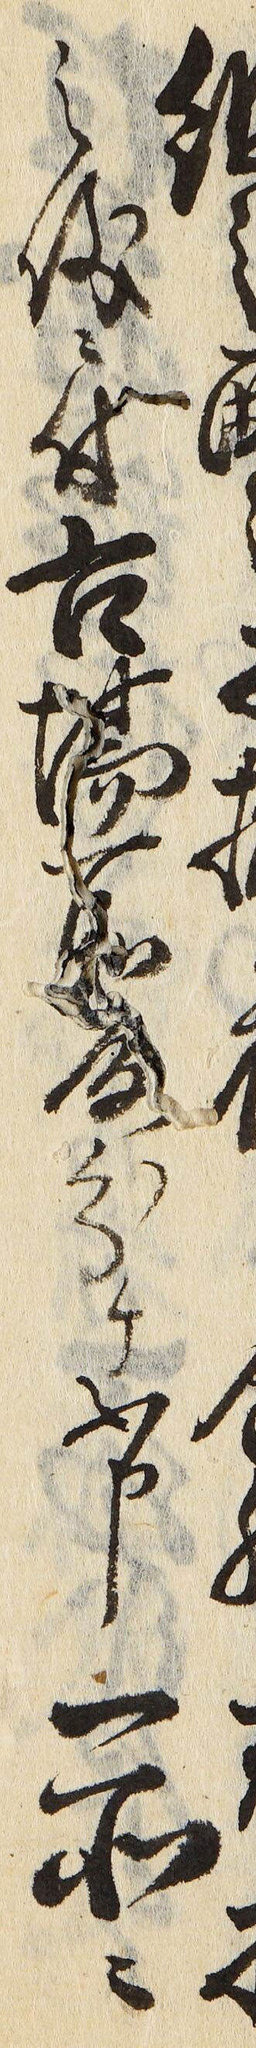之儀ニ付右場所分ケ不申一所ニ
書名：御領海江異国船漂流有之節御手当之次第大組頭心得之廉々書集記
